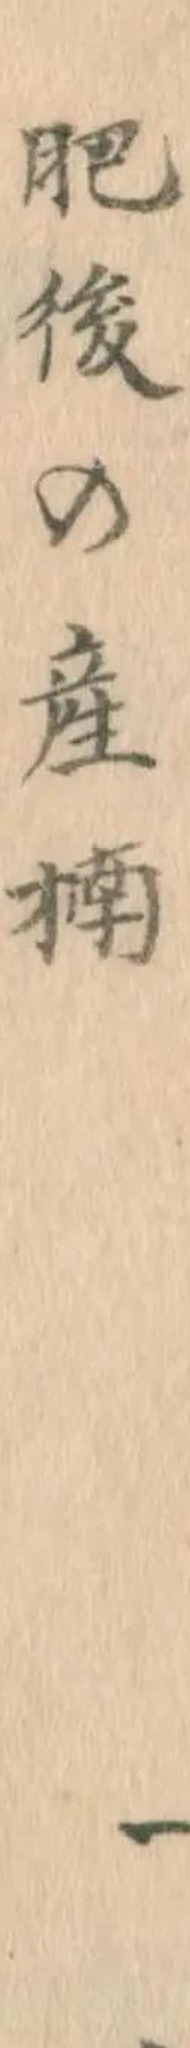肥後の産楠
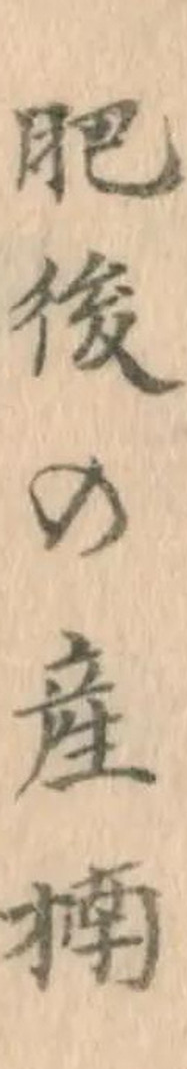肥後の産楠
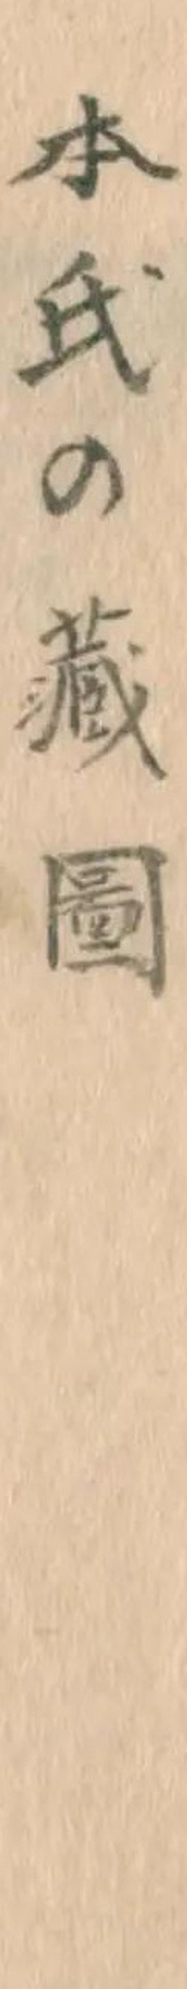本氏の蔵図
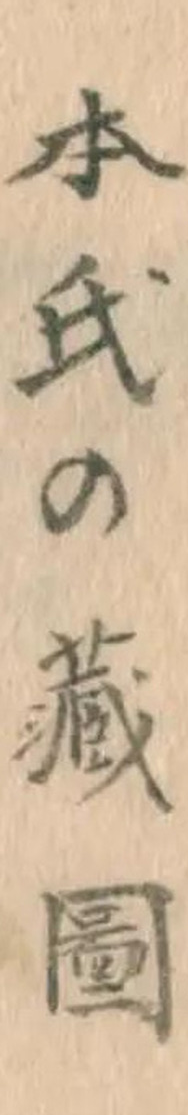本氏の蔵図
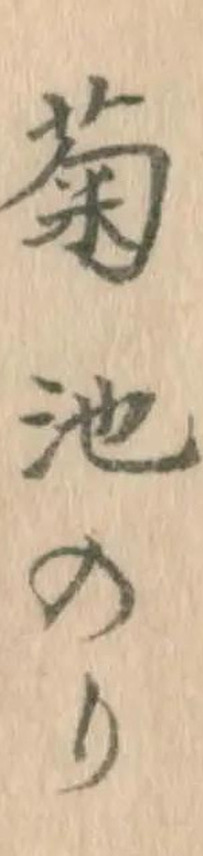菊池のり
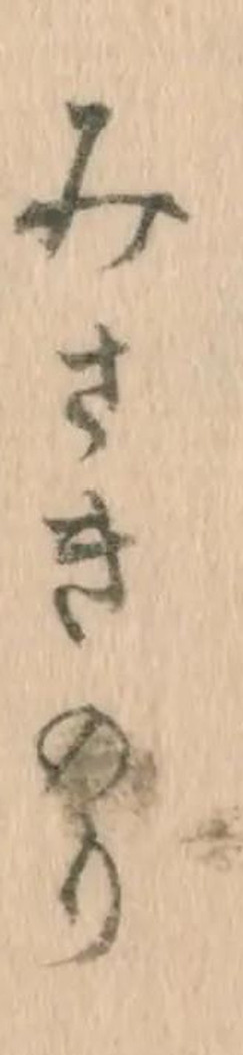みさきのり
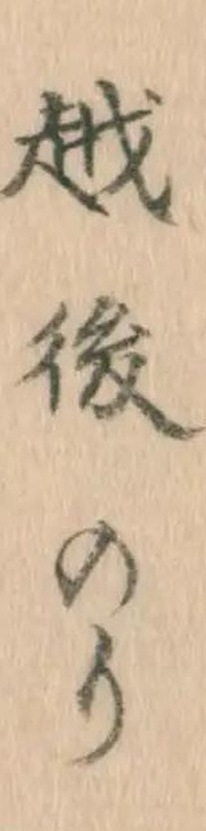越後のり
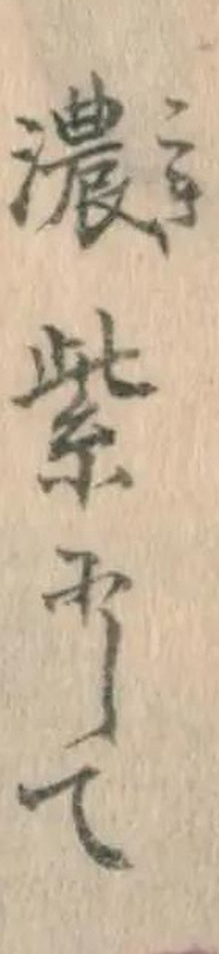濃紫にして
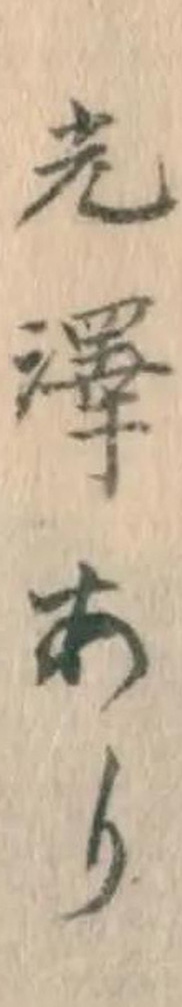光沢あり
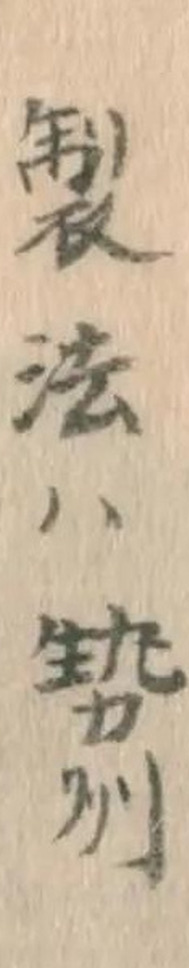製法は勢州
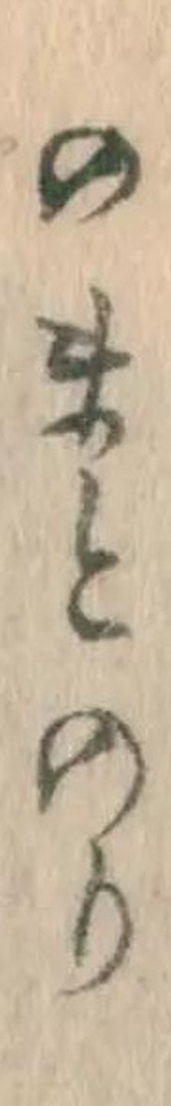のまとのり
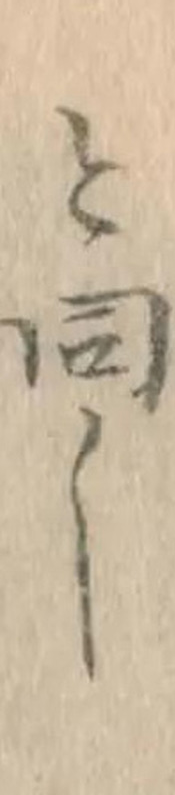と同し

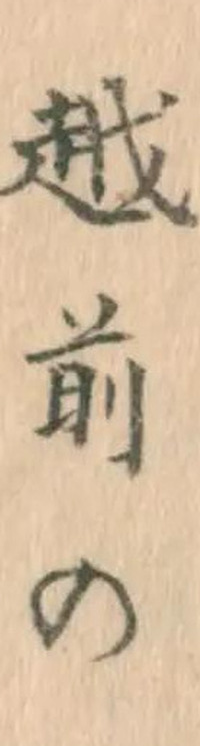越後の
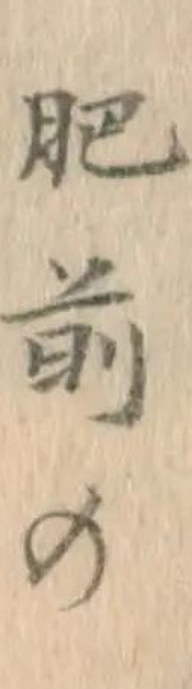肥前の
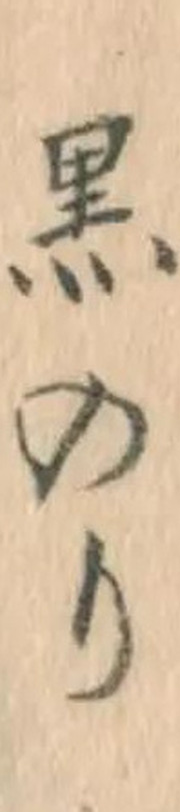黒のり
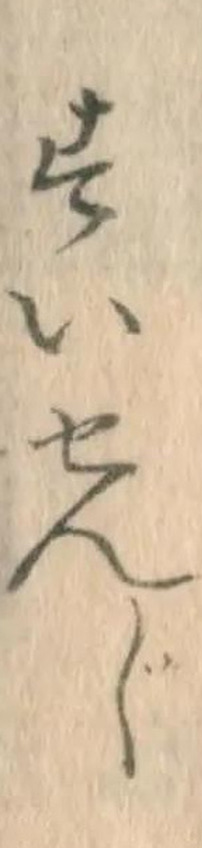すいせんじ
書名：本草図譜. 巻52-54
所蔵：国立国会図書館 National Diet Library, JAPAN
